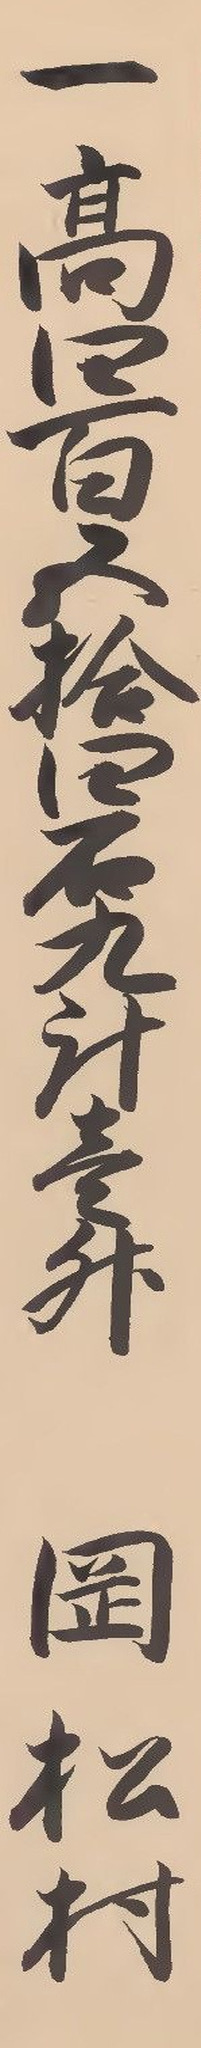一高四百五拾四石九斗壱升岡松村
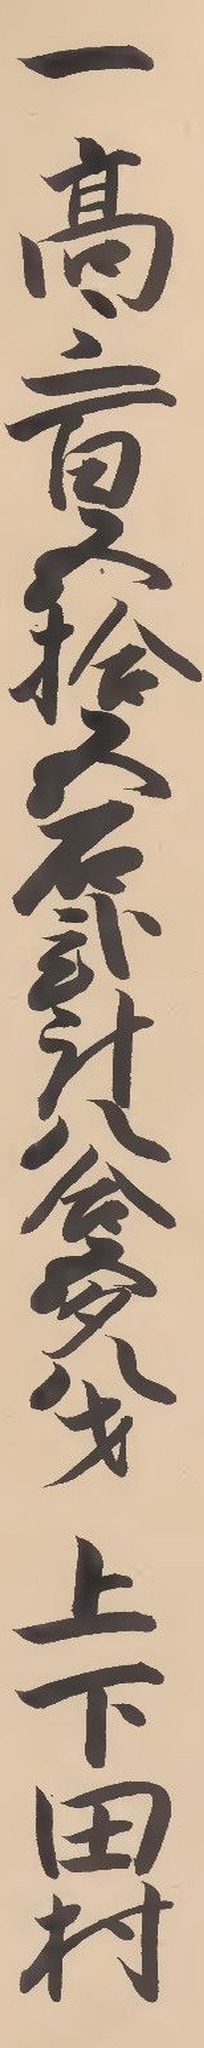一高三百五拾五石弐斗八合五勺八才上下田村

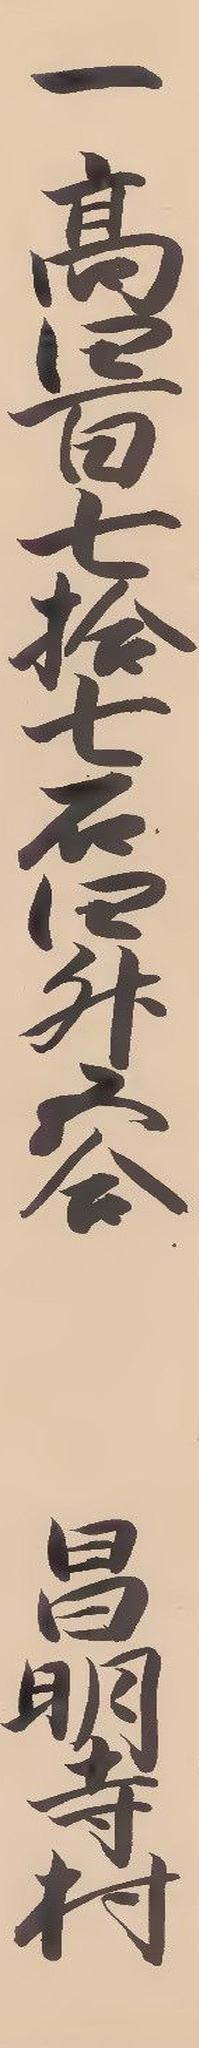一高四百七拾七石四升五合昌明寺村
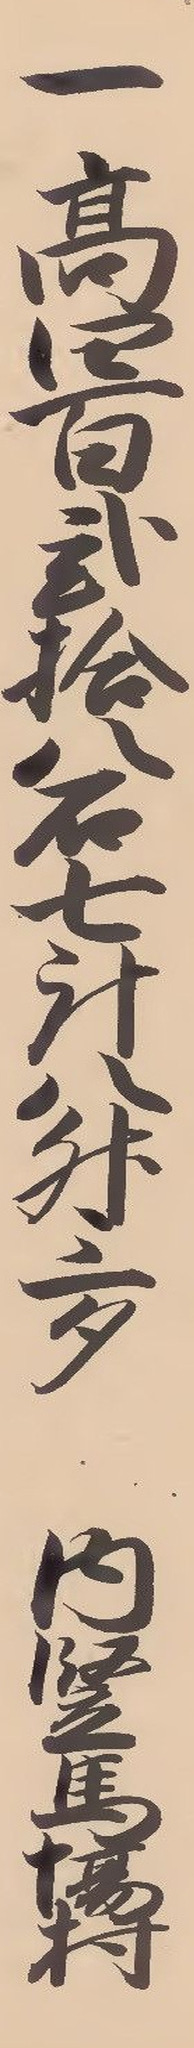一高四百弐拾八石七斗八升三勺内竪馬場村
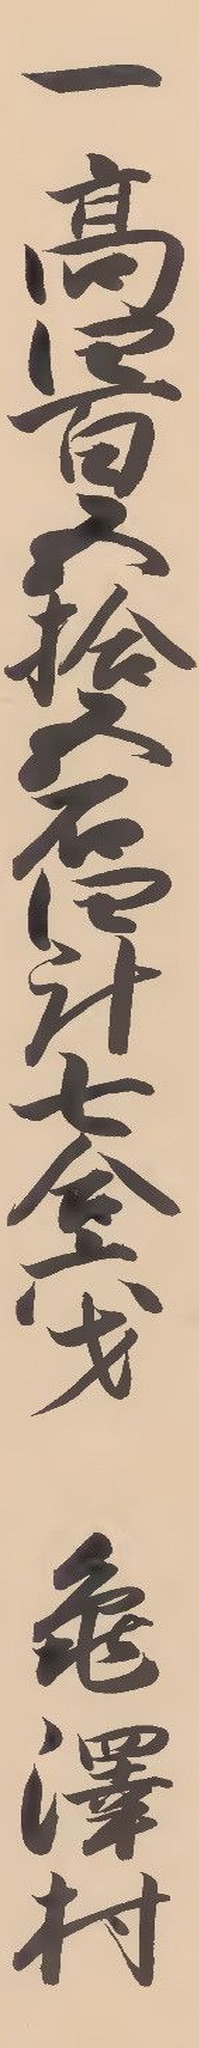一高四百五拾五石四斗七合六才亀沢村
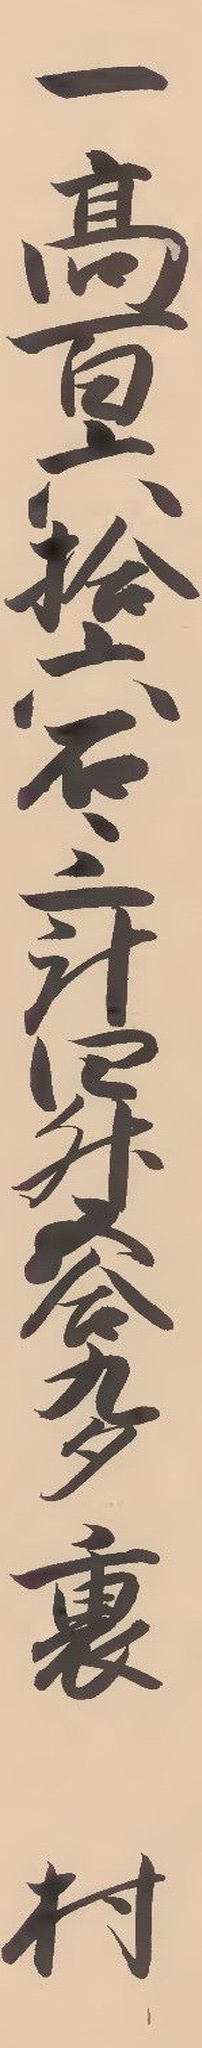一高百六拾六石三斗四升五合九勺裏村
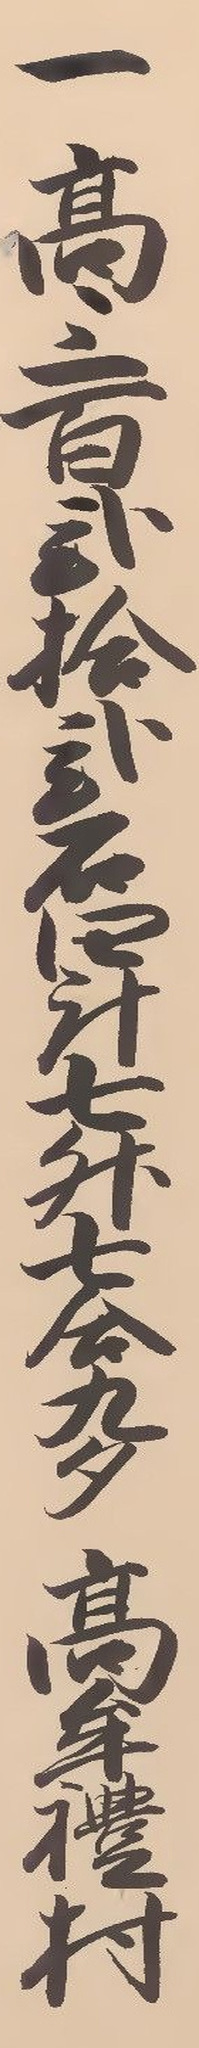一高三百弐拾弐石四斗七升七合九勺高牟礼村
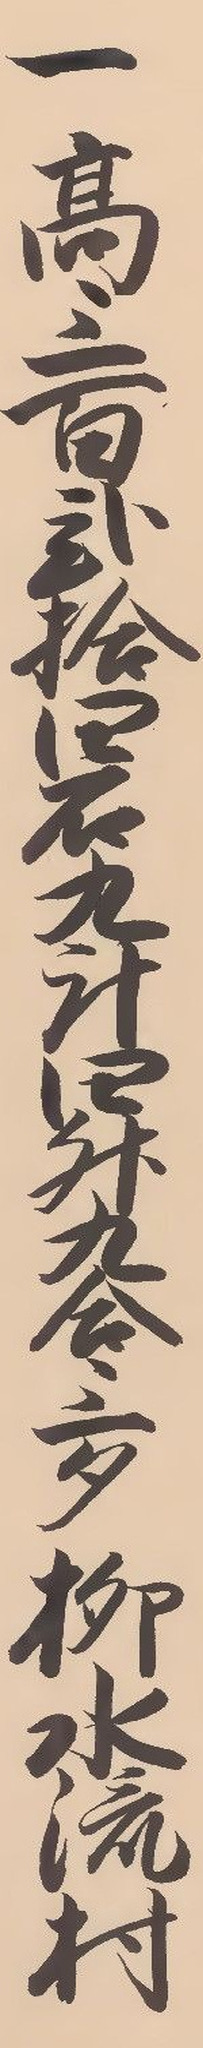一高三百弐拾四石九斗四升九合三勺柳水流村
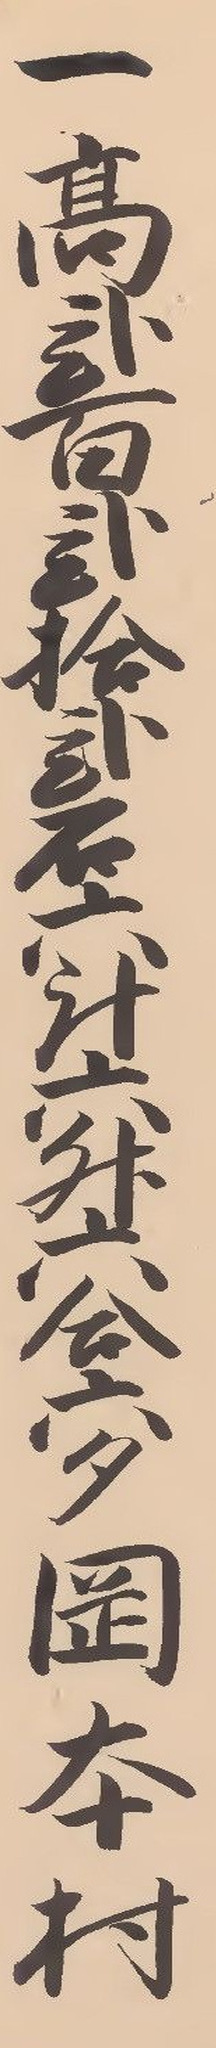一高弐百弐拾弐石六斗六升六合六勺岡本村
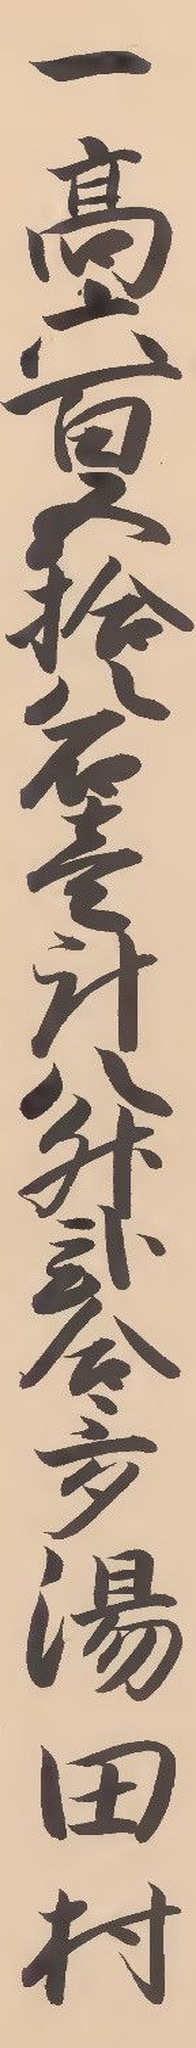一高六百五拾八石壱斗八升弐合三勺湯田村

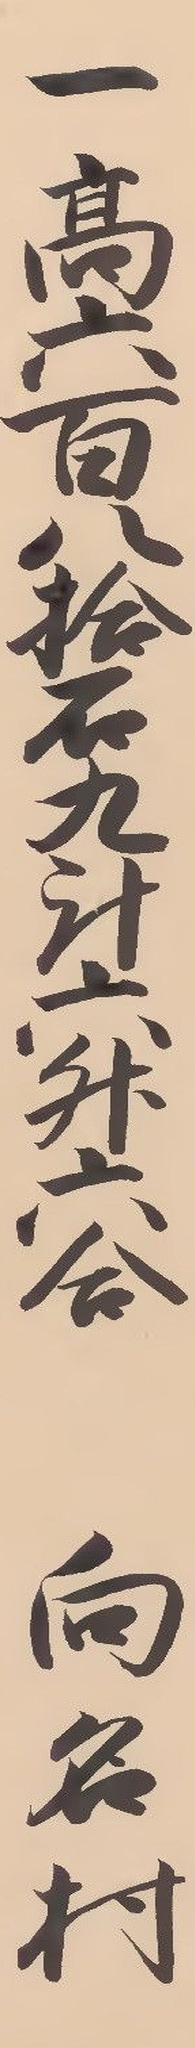一高六百八拾石九斗六升六合向名村
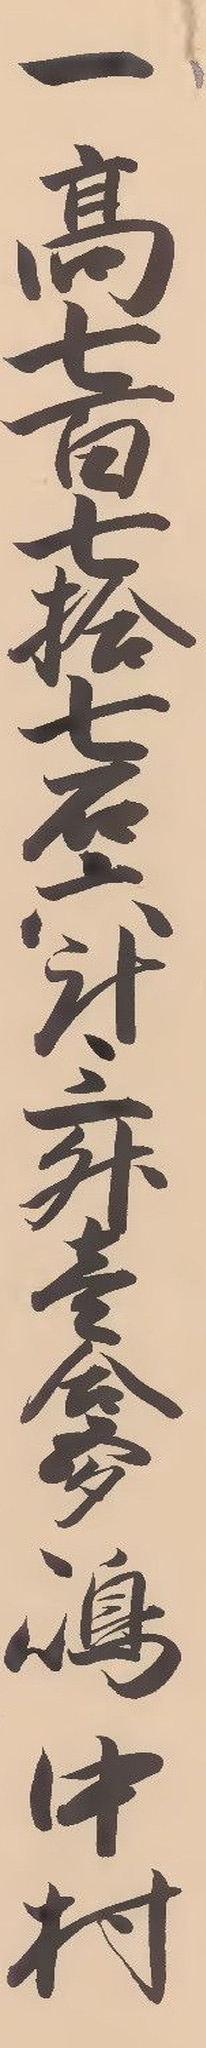一高七百七拾七石六斗三升壱合五勺島中村
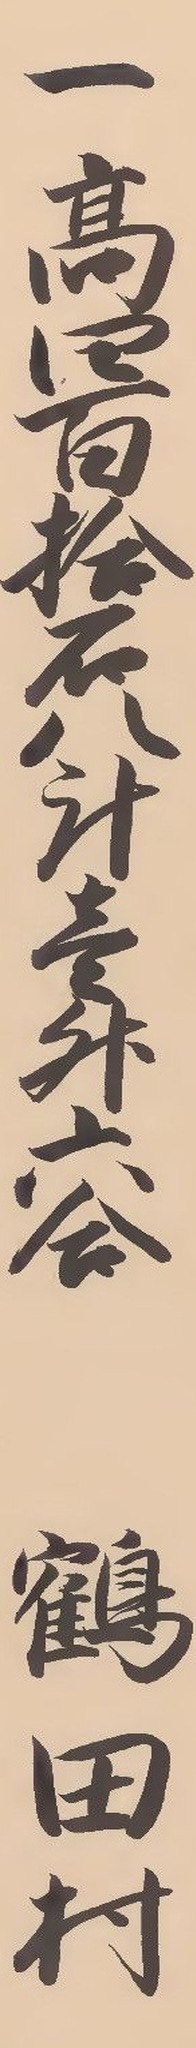一高四百拾石八斗壱升六合鶴田村
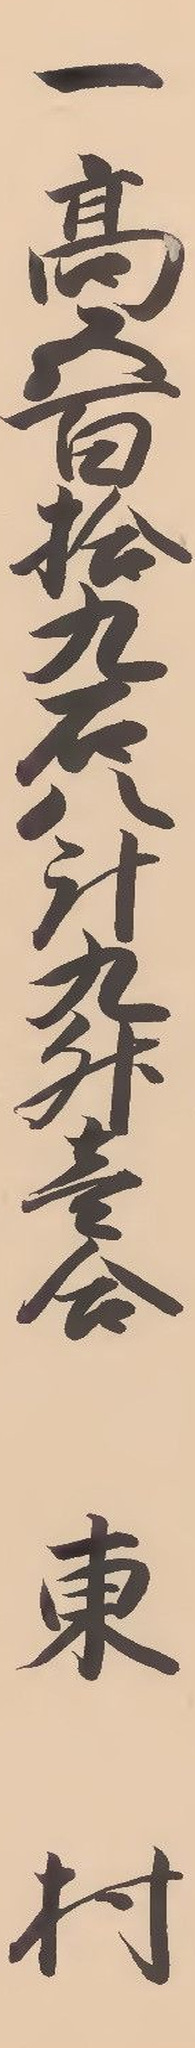一高五百拾九石八斗九升壱合東村
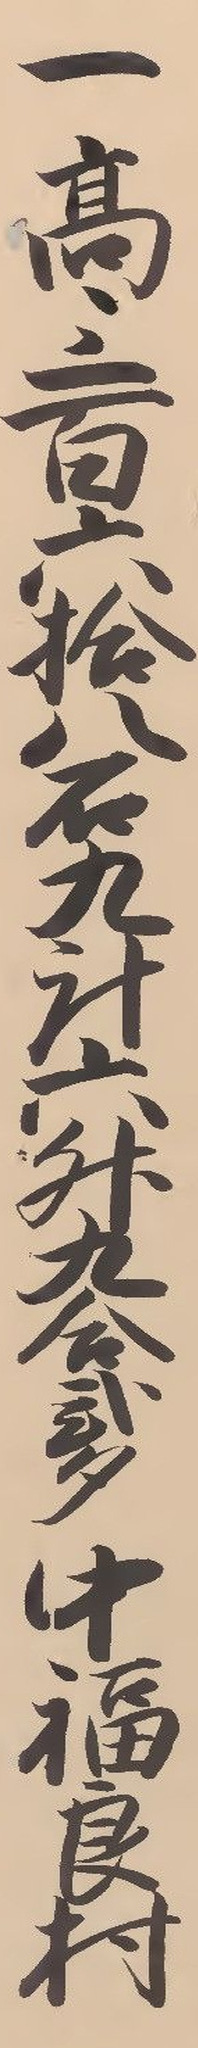一高三百六拾八石九斗六升九合弐勺中福良村
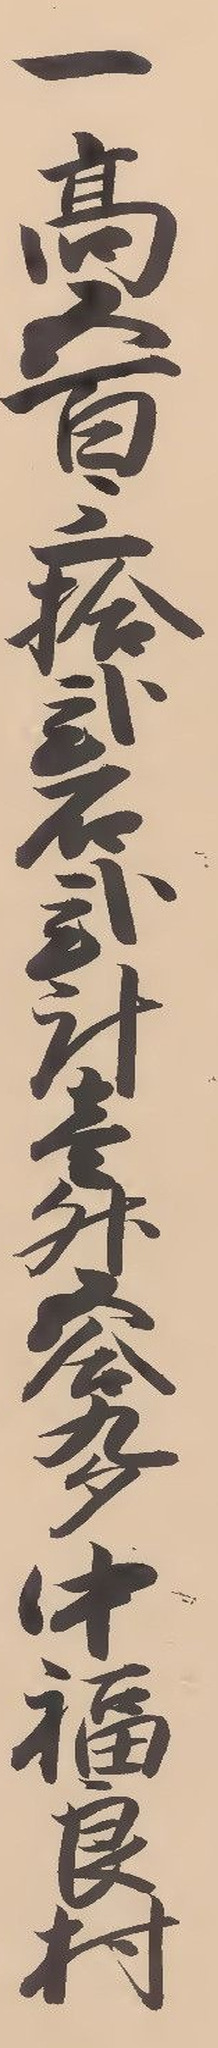一高五百三拾弐石弐斗壱升五合九勺中福良村
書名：日向国郷帳
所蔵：国立公文書館 National Archives of Japan
